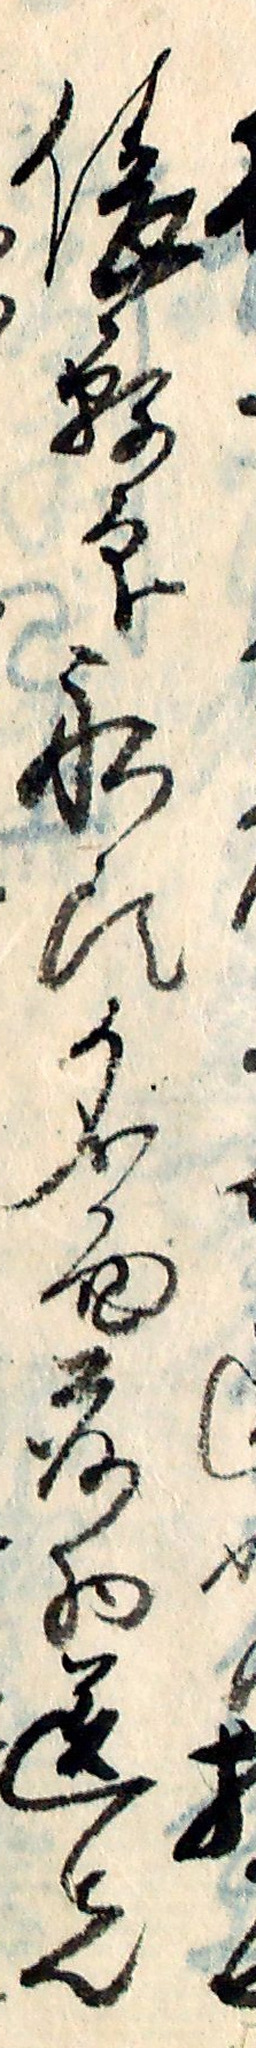俵数印船頭名面荷物送先
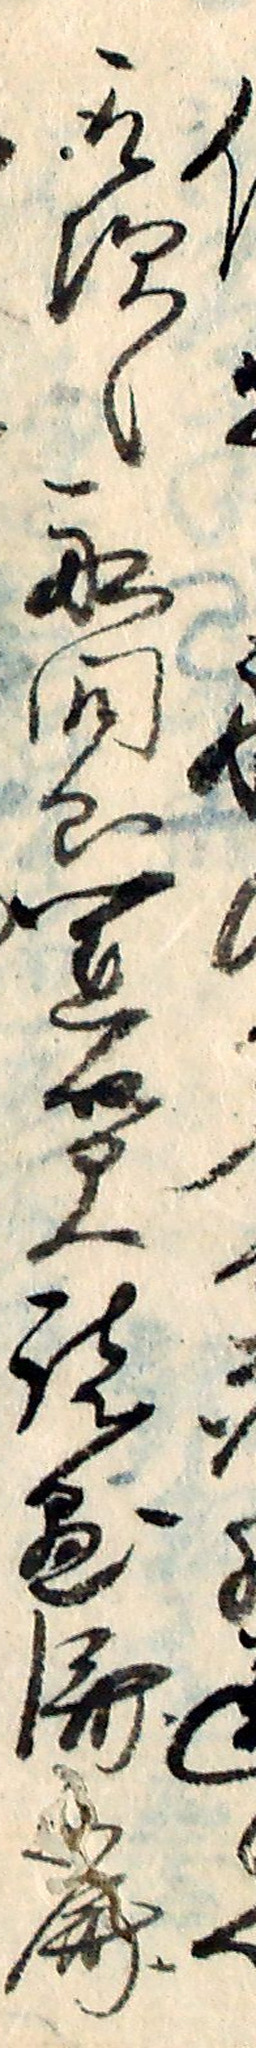取次之船問屋運賃諸懸済不済
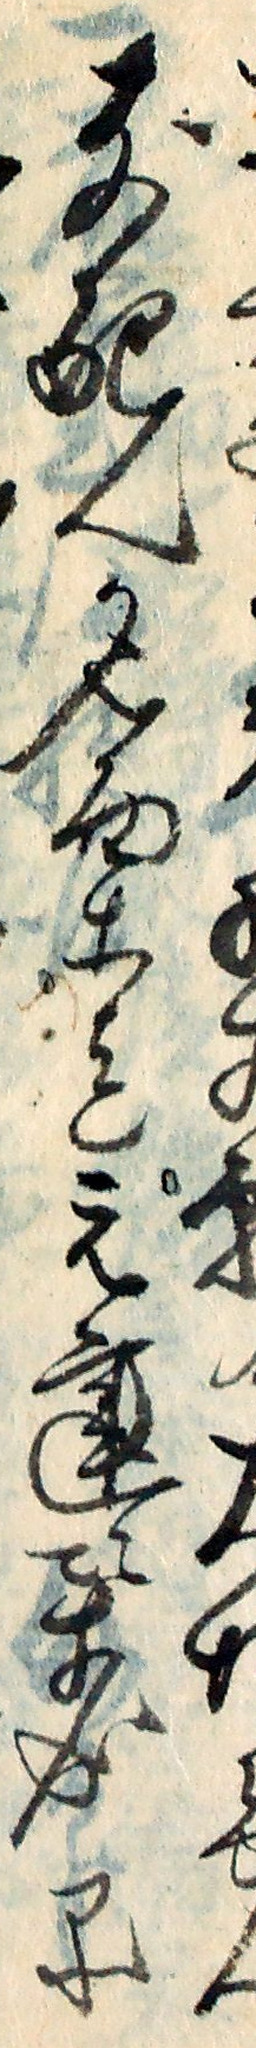支配人名面等迄元建に可相成品
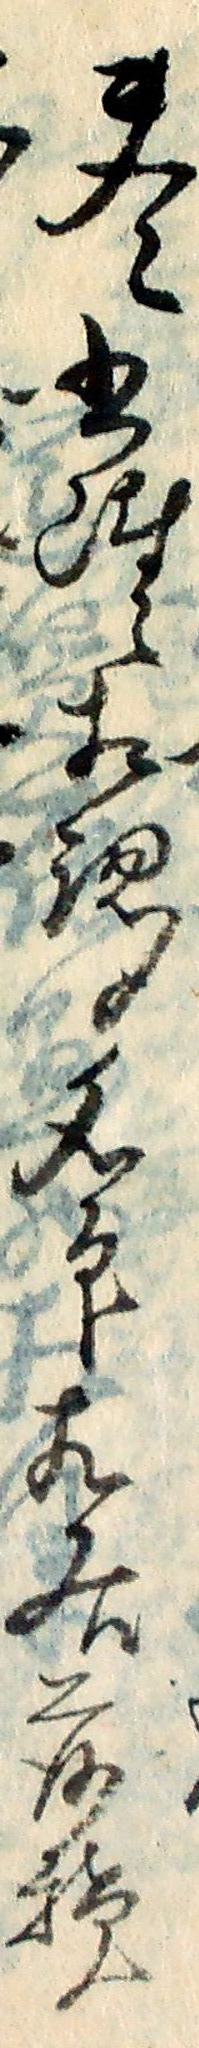夫々書附に相認め名印相居荷積
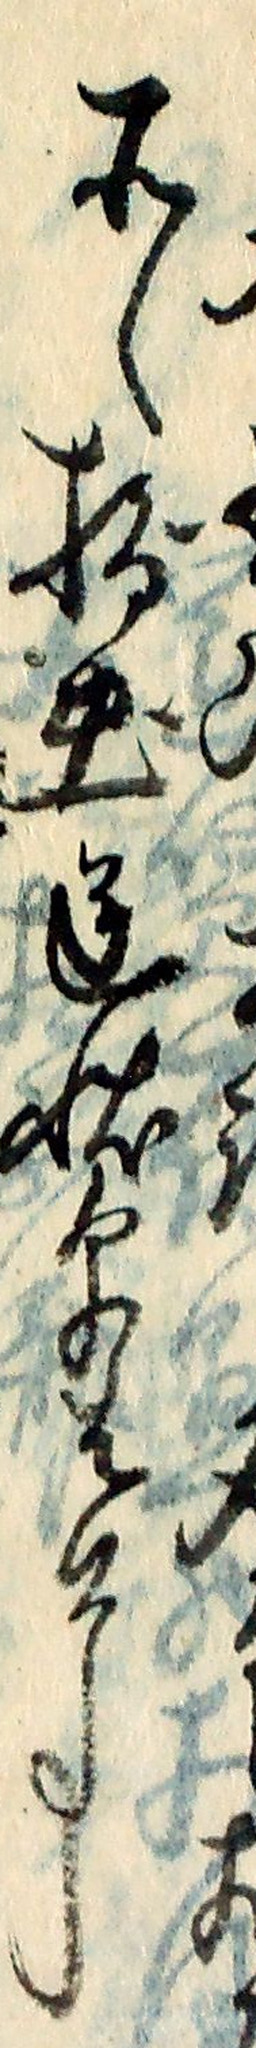所へ指出送状受取候事
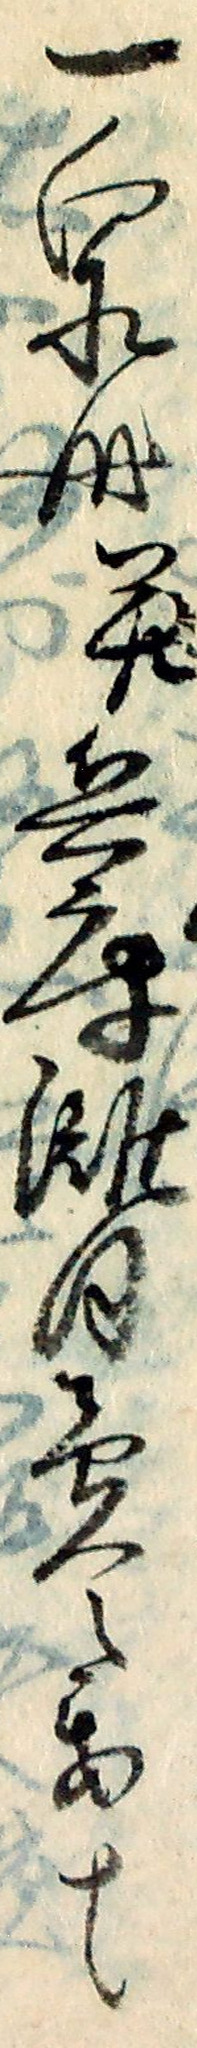一泉州并兵庫灘向売之義は
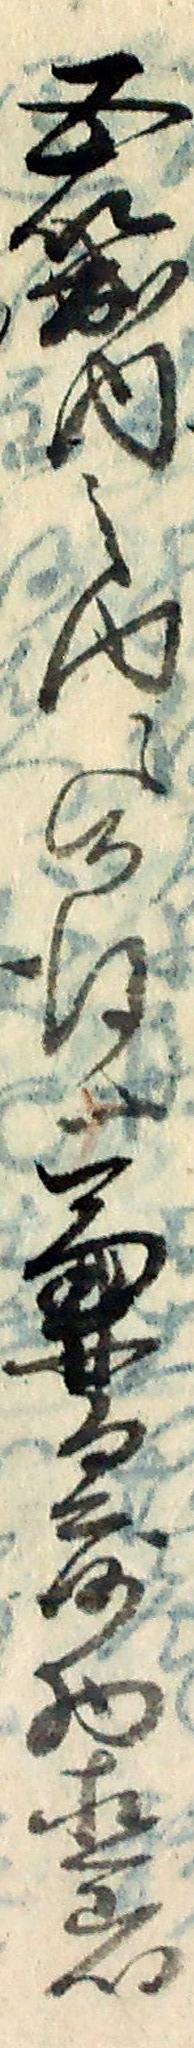五畿内之内に候得は兼て荷物直着
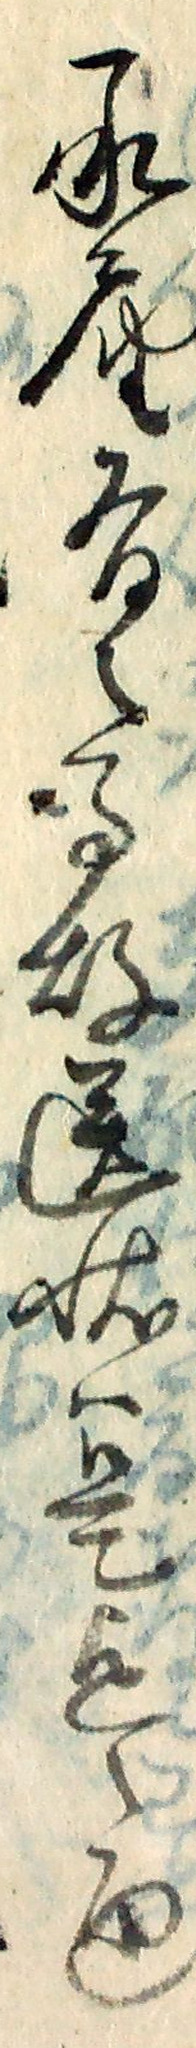承届有之事故送状は是迄之通
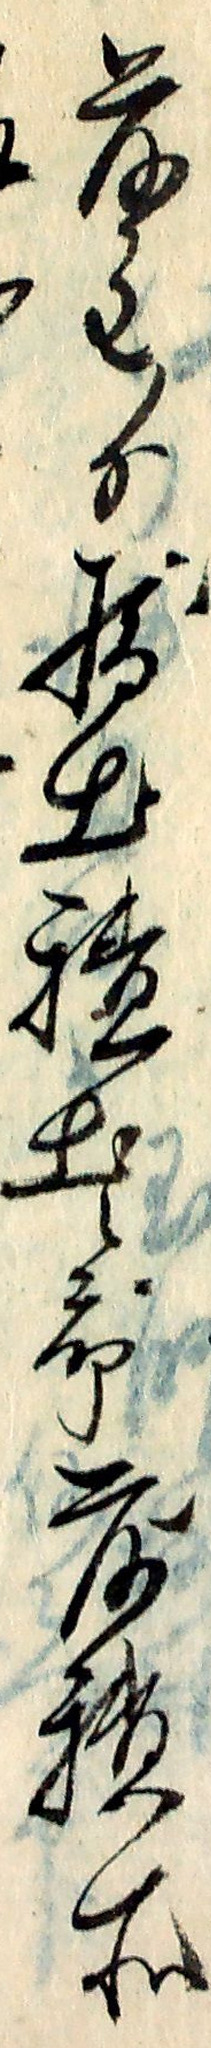荷主ゟ指出積出之節荷積所
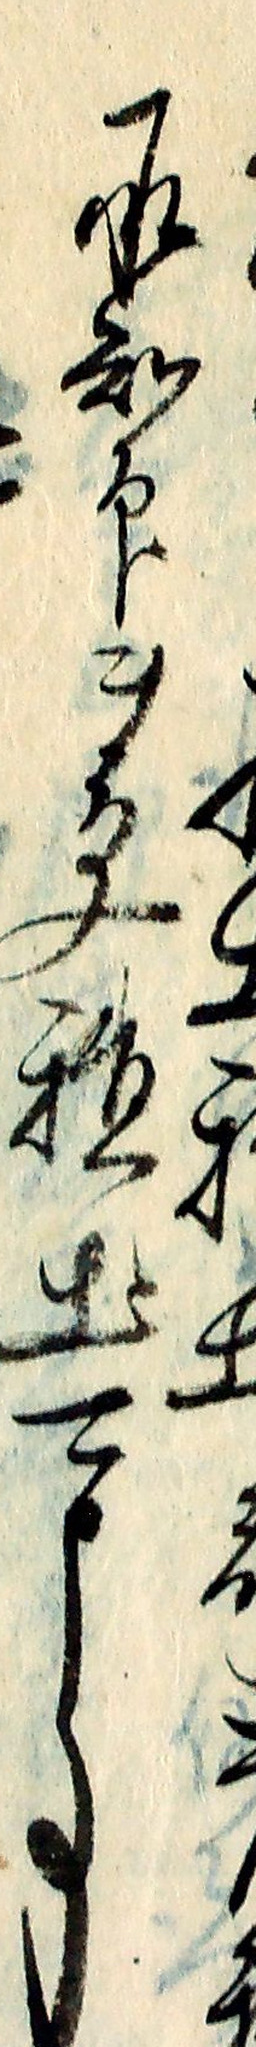承知印を受積出可申事
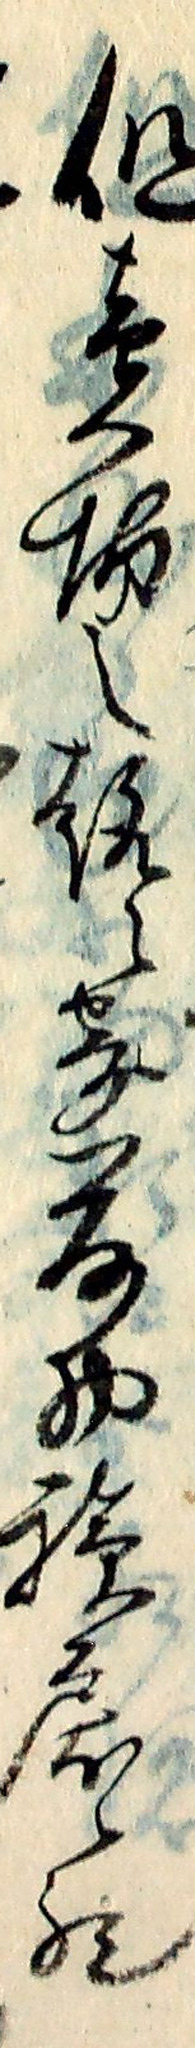但売場之趣に寄荷物積戻候歟
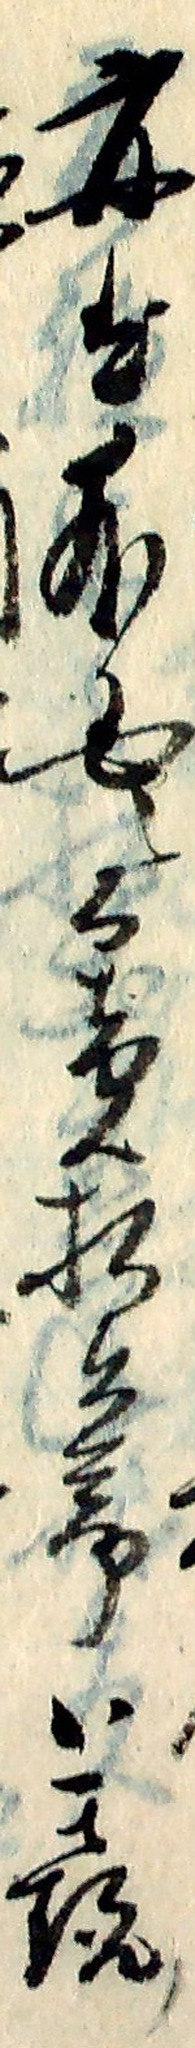亦は外国にて売払候節は其趣
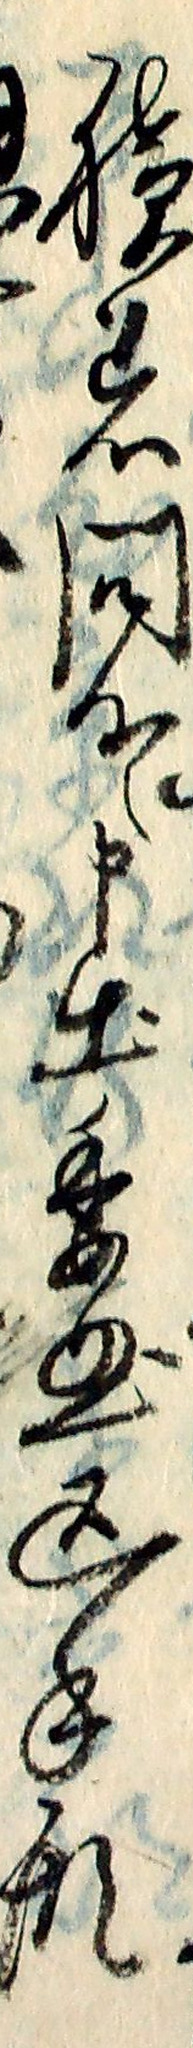積着問屋へ申出委曲返手形
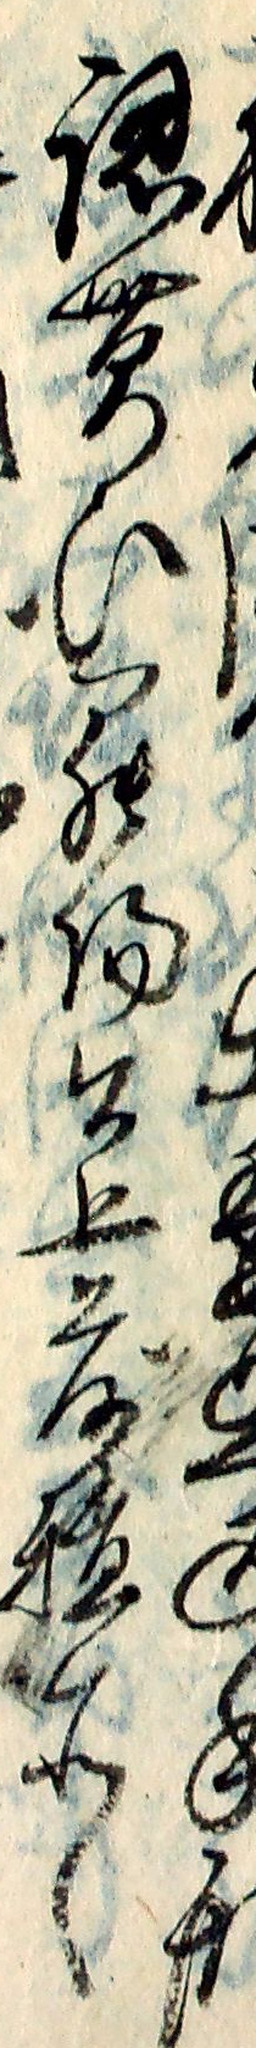認貰ひ罷帰候上荷積所へ
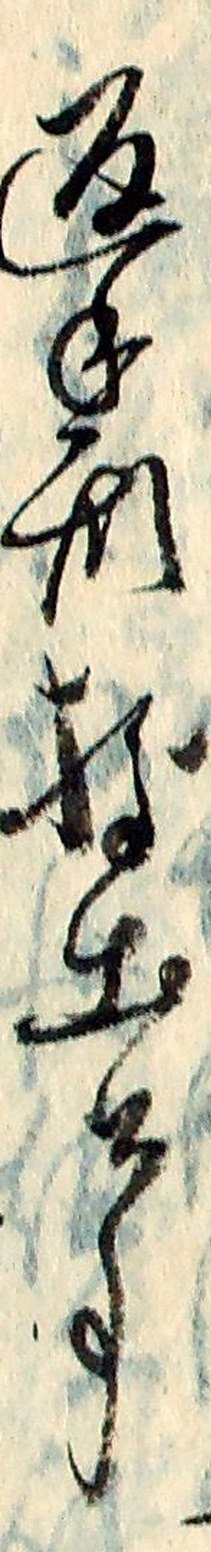返手形指出候事
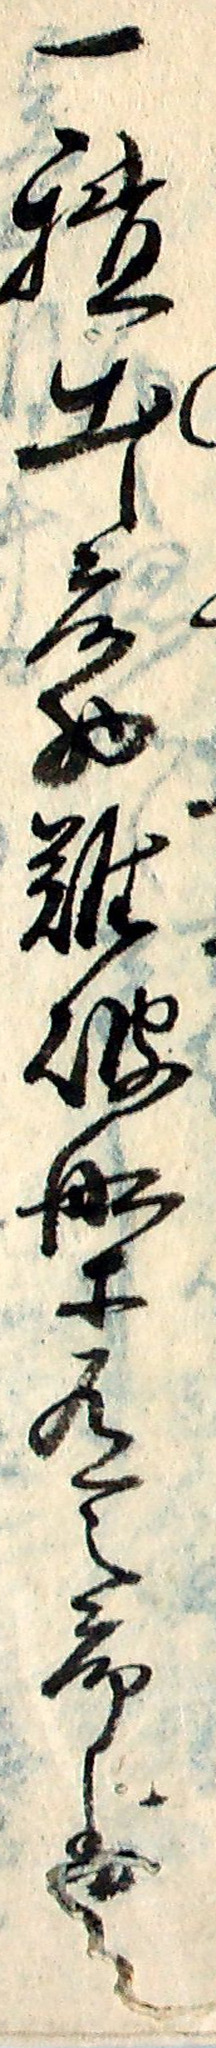一積出之荷物難破船等有之節は
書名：諸御願書控(後藤氏壱番）
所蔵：鳴門教育大学 Naruto University of Education
